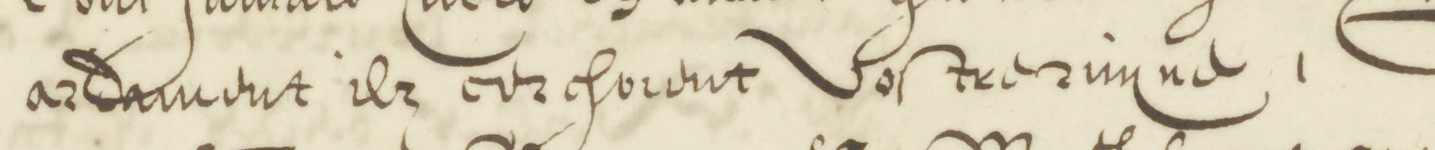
ardament ilz cerchoient vostre ruyne, Ce
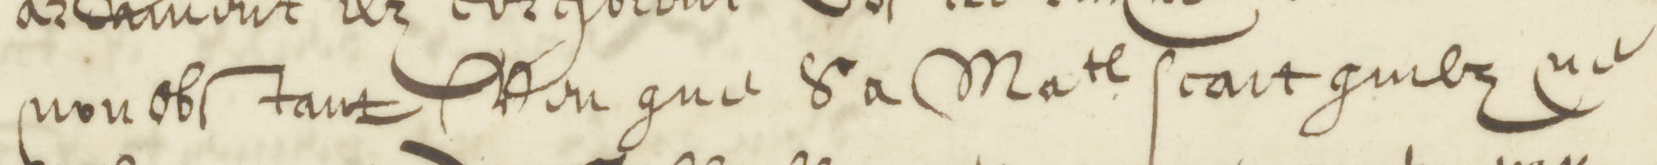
non obstant veu que Sa Mate. scait quilz ne
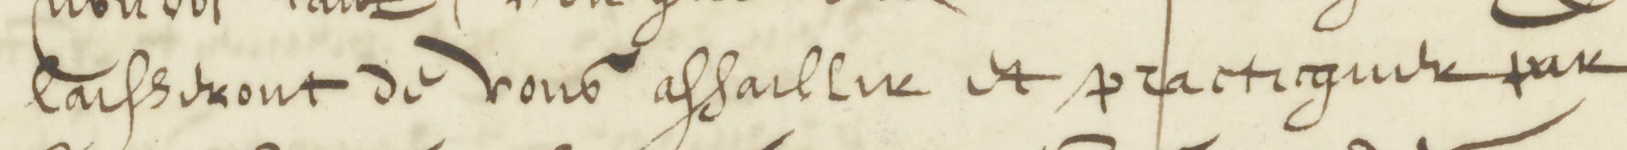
laisseront de vous assaillir et practicquer par
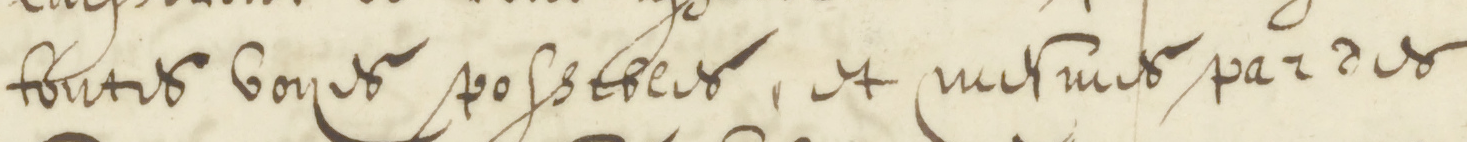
toutes voyes possibles, et mesmes par des
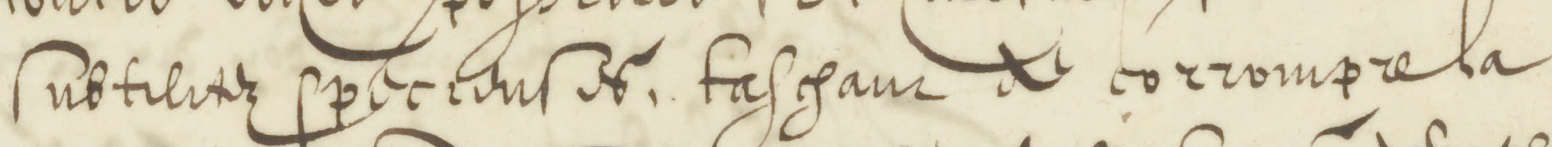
subtilitez specieuses, taschant de corrompre la
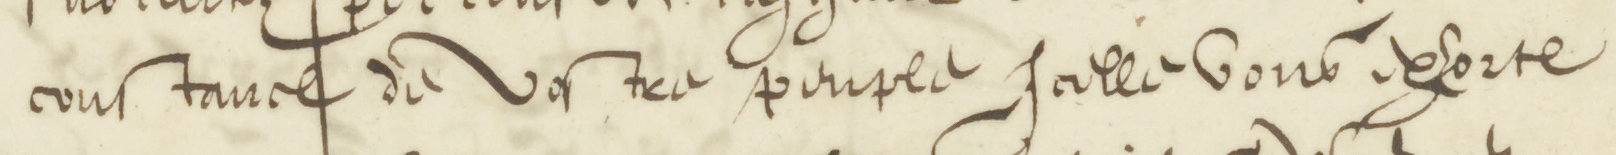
constance de vostre peuple Icelle vous exhorte
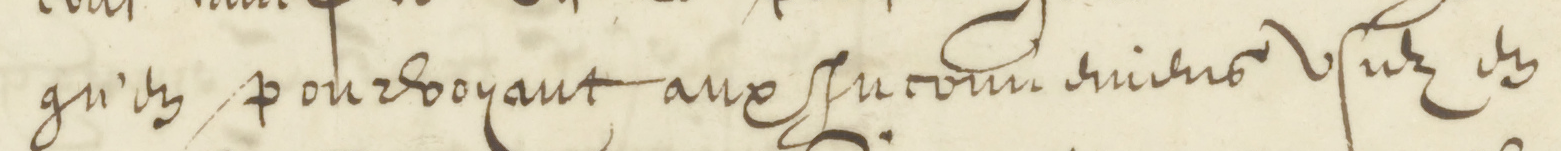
qu‛en pourvoyant aux Inconuenieus usiez en
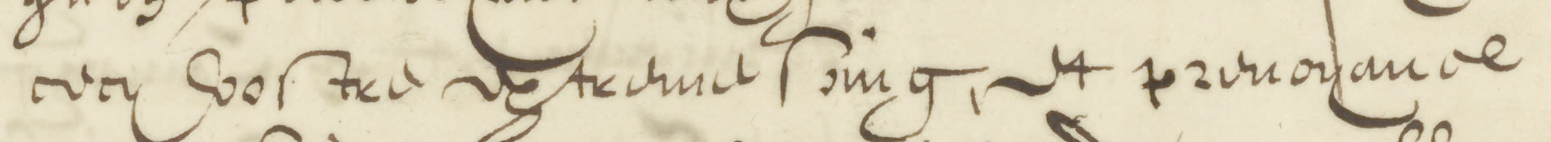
cecy vostre extreme soing, et preuoyance
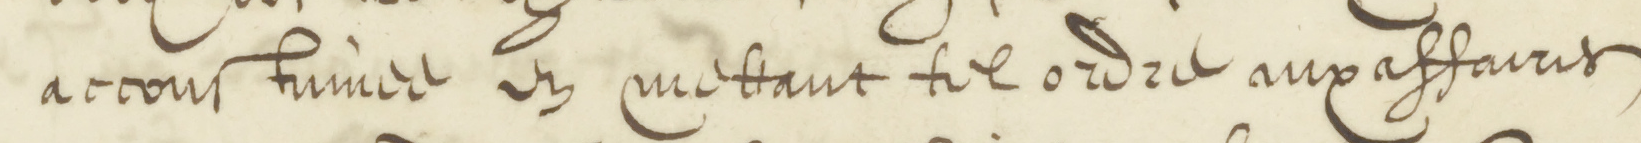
accoustumuee en mettant tel ordre aux affaires,
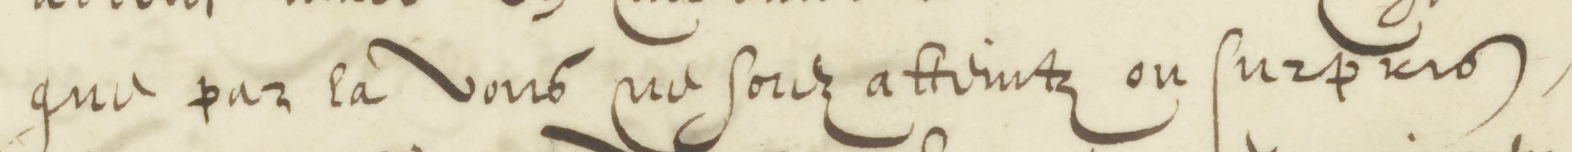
que par la vous ne soiez atteintz ou surpris.
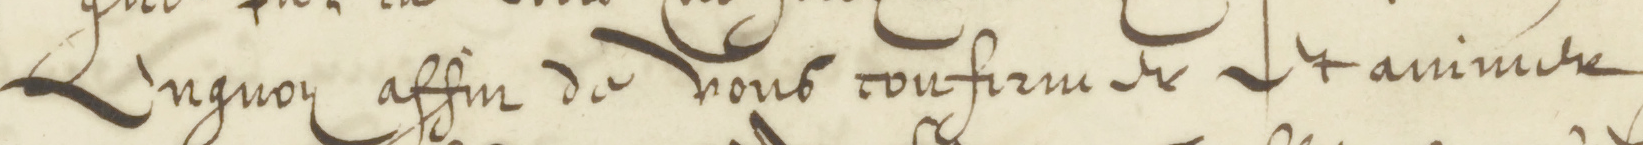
Enquoy affin de vous confirmer et animer
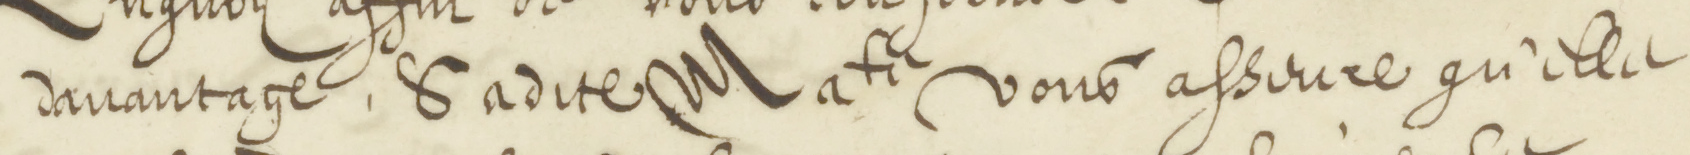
dauantage, Sadite Mate. vous asseure qu‛elle
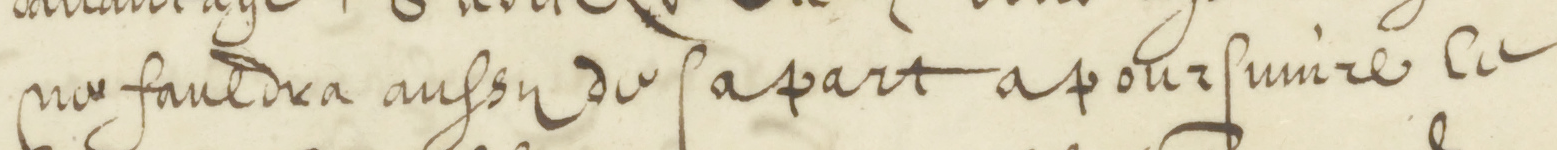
ne fauldra aussy de sa part a pour suiure le
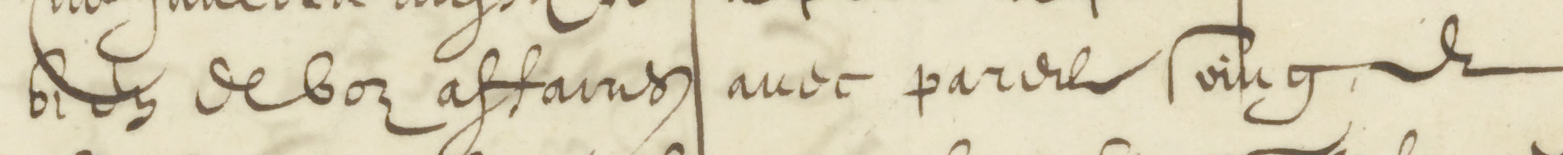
bien et bon affaires auec pareil soing, et
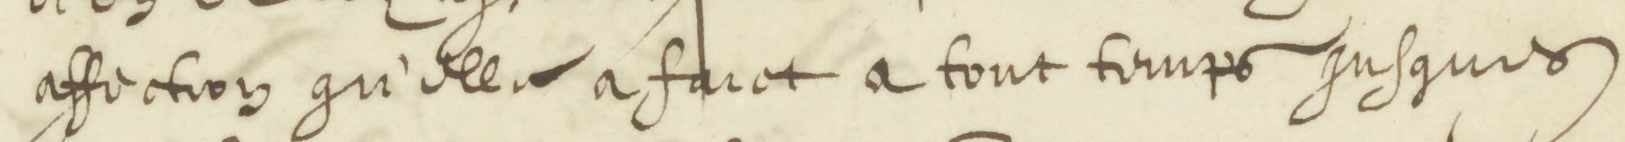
affection qu‛elle a faict a tout temps jusques
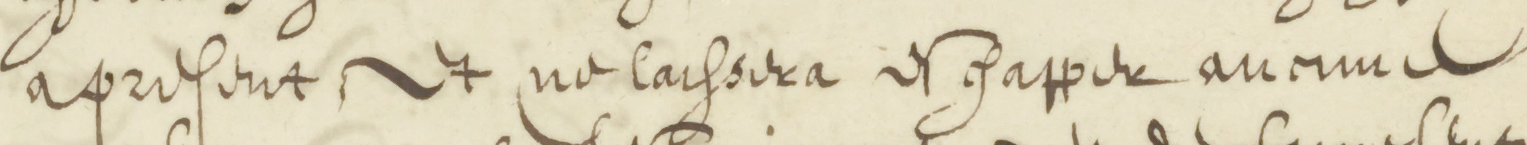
a present et ne laissera eschapper aucune
